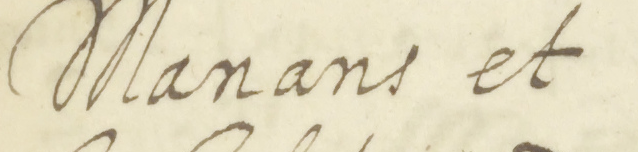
Manans et
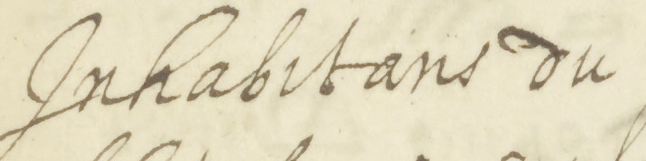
Inhabitans du
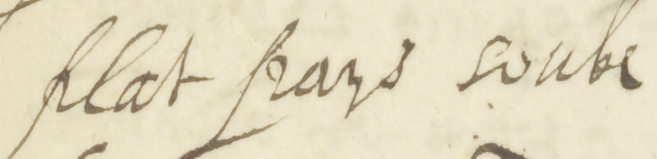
Plat Pays soubz
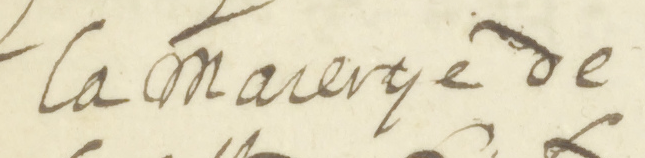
la Maierye de
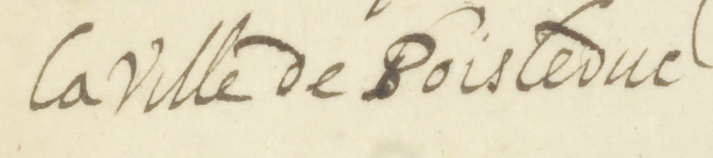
la ville de Boisleduc
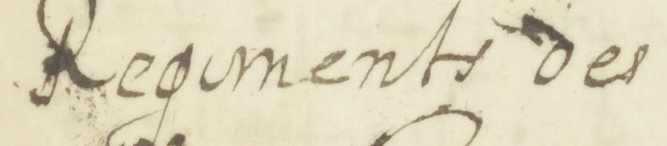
Regiments des
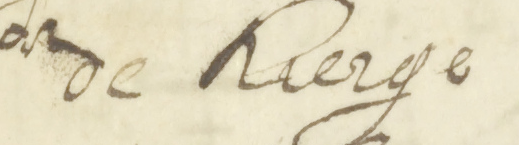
srs. de Hierge
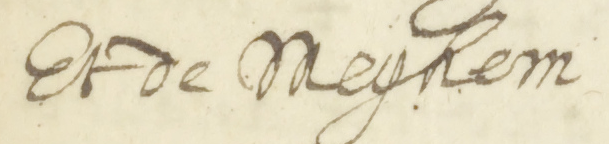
Et de Meghem
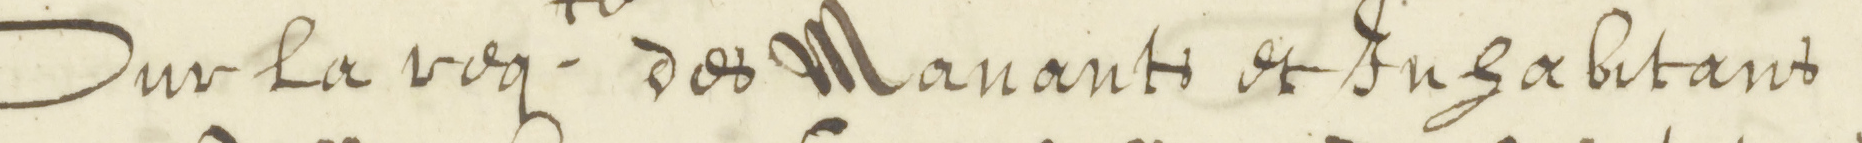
Sur la reqte. des Manants et Inhabitans
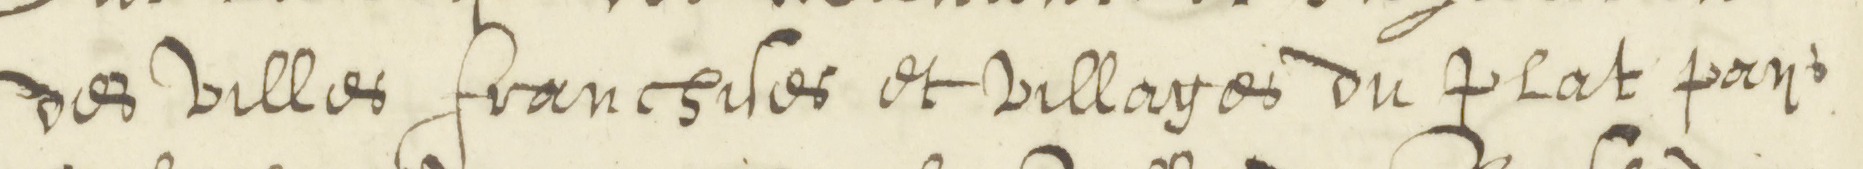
des villes Franchises et villages du Plat Pays
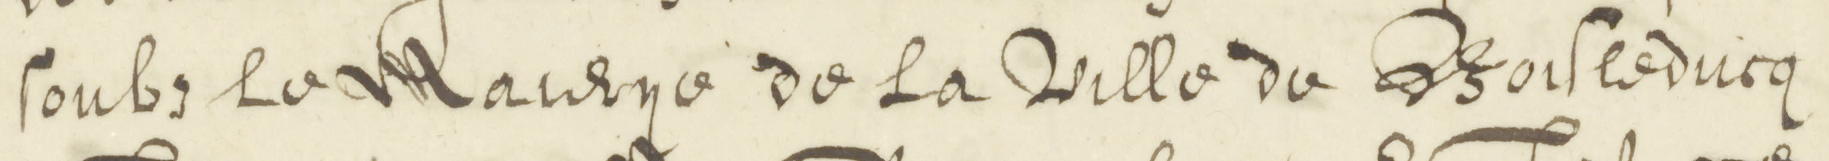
soubz le Maierye de la Ville de Boisleducq
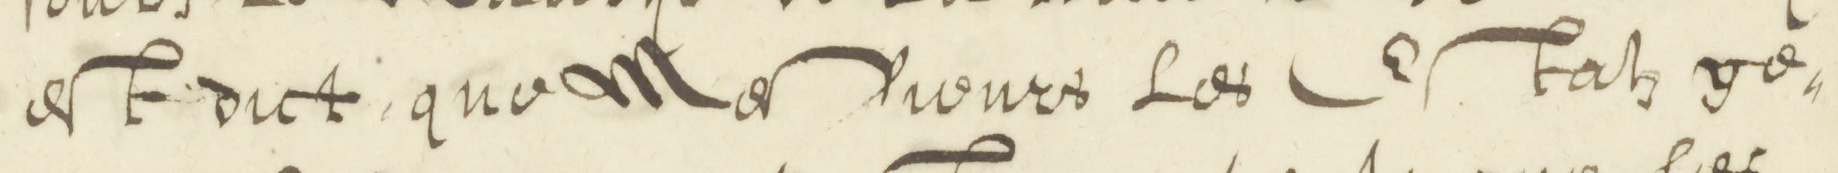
est dict, que Messieurs les Estatz ge„
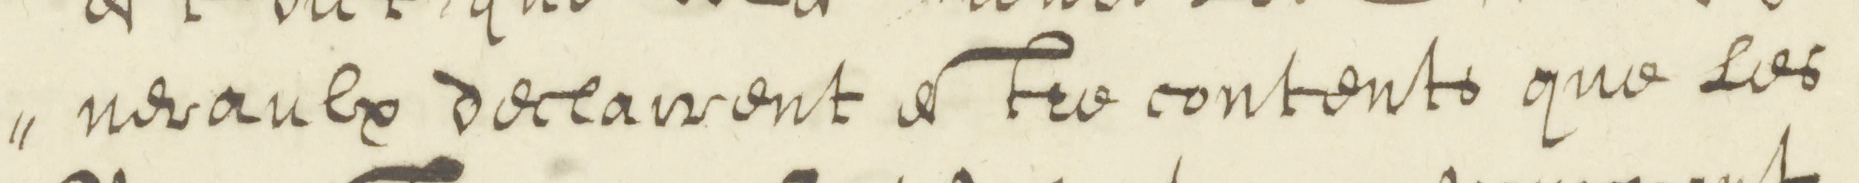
„neraulx declairent estre contents que les
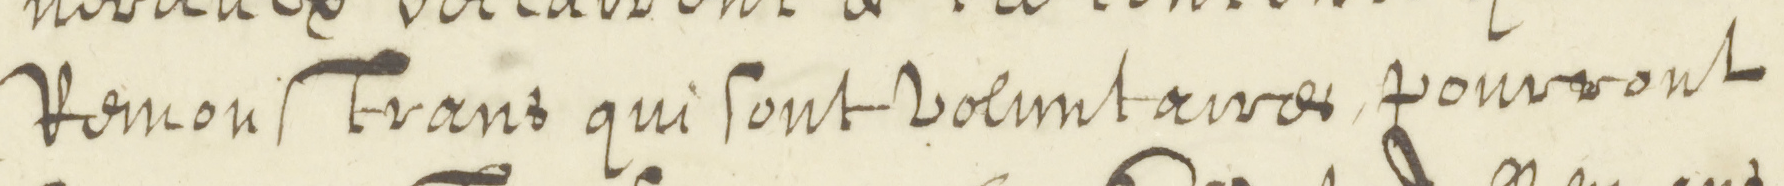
Remonstrans qui sont voluntaires, pourront
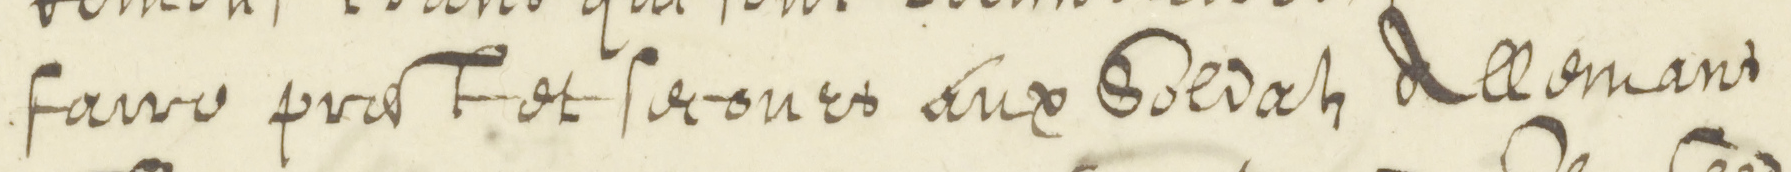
faire prest et secours aux Soldatz Allemans
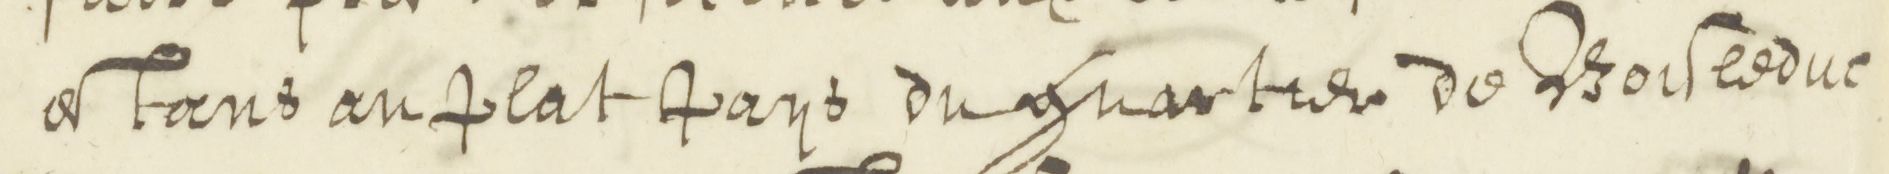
estans au Plat Pays du quartier de Boisleduc
